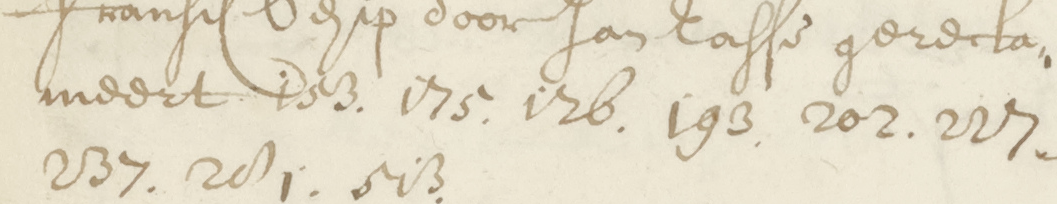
meert 153, 175, 176, 193, 202, 227
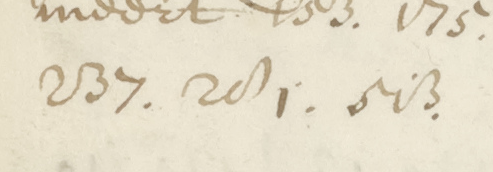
237, 281, 513.
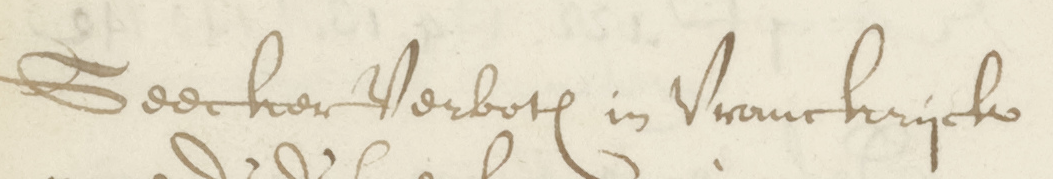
Seecker Verboth in Vranckrijck
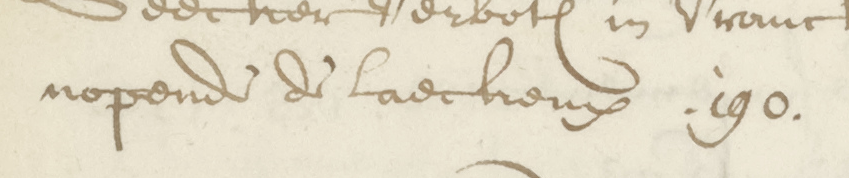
nopende de laeckenen, 190.
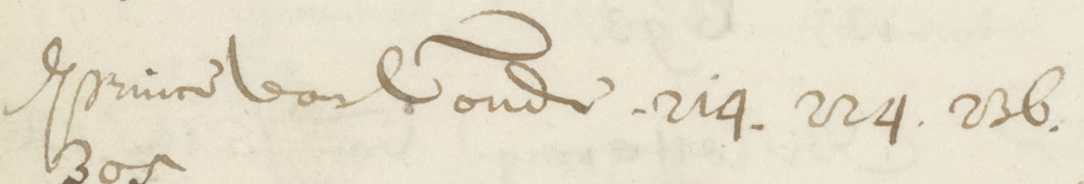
Prince van Conde, 214, 224, 236,
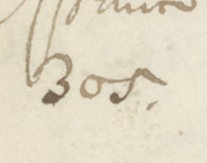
305.
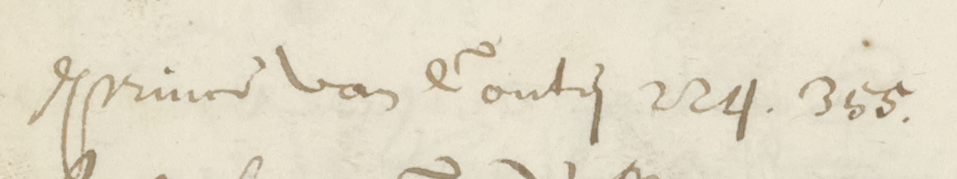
Prince van Contij 224, 355.
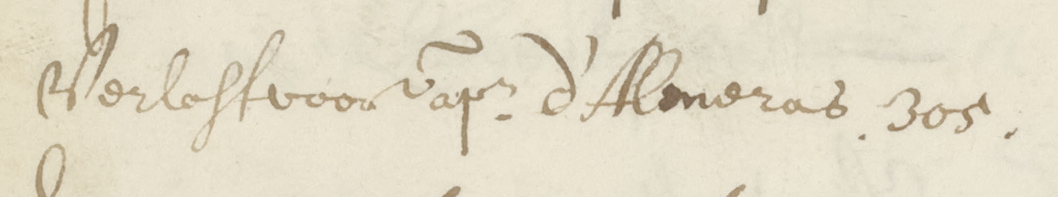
Verloff voor Capn d'Almeras, 305.
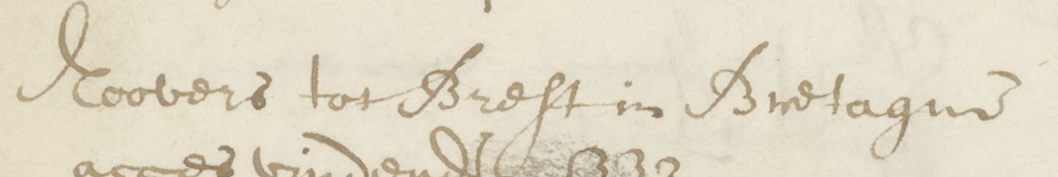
roovers tot Brest in Bretagne
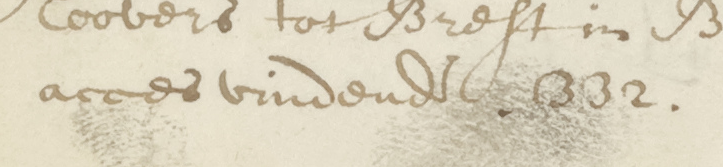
acces vindende, 332.
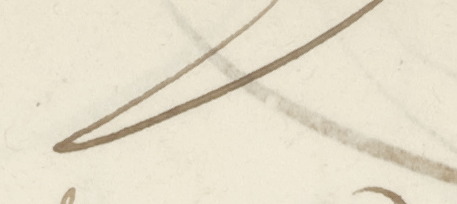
V
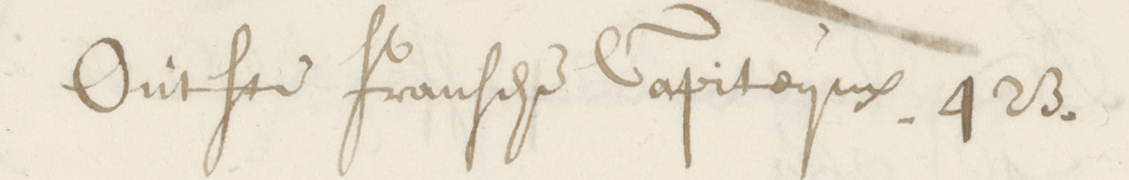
Outste Fransche Capiteijnen, 423.
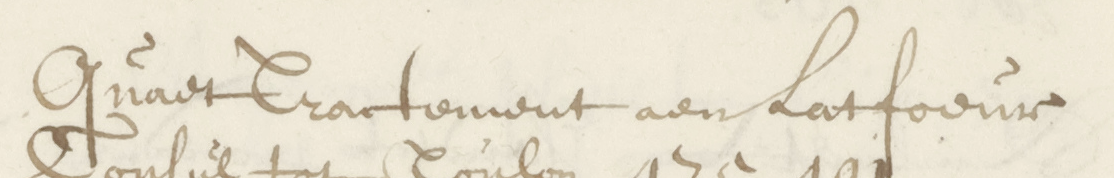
Quaet Tractement aen Latfoeur
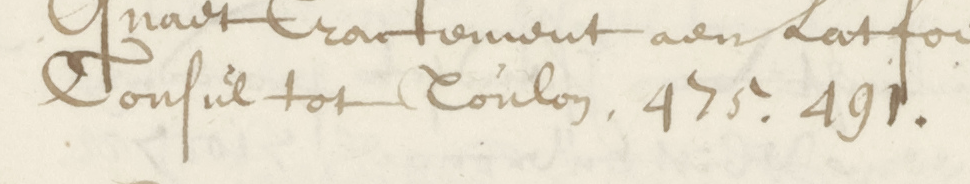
Consul tot Toulon, 475, 491.
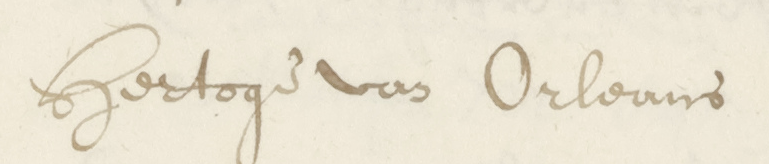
Hertoge van Orleans
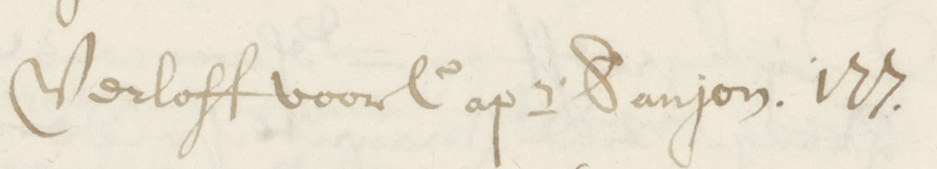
Verloff voor Capn. Sanjon, 177.
